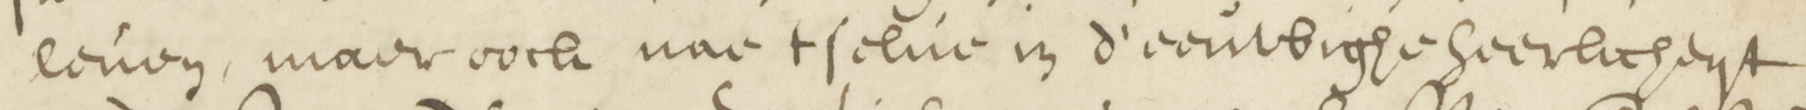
leuen, maer oock nae 'tselue in d‛eeuwighe heerlicheyt
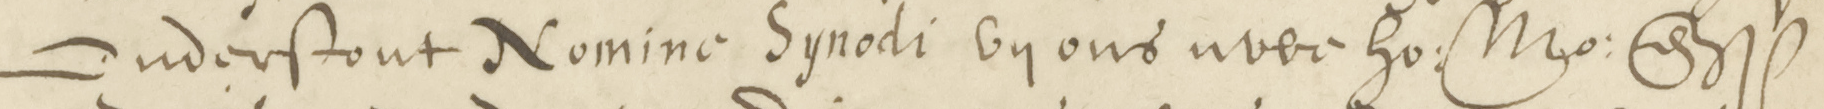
Onderstont Nomine Synodi by ons uwe ho:Mo: & Pe.
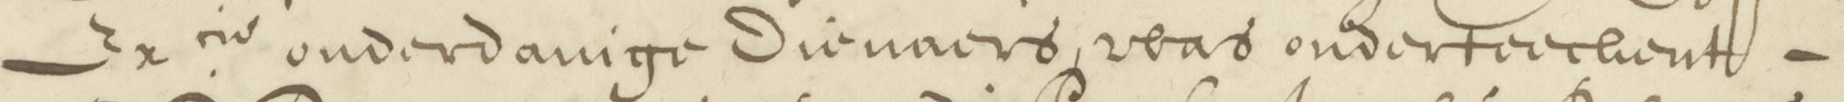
Excie. onderdanige Dienaers was onderteeckent
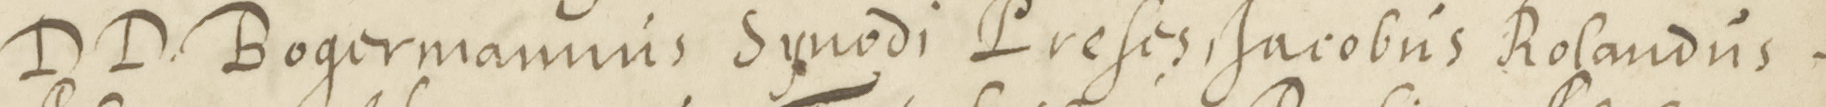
D D. Bogermannus Synodi Preses, Jacobus Rolandus,
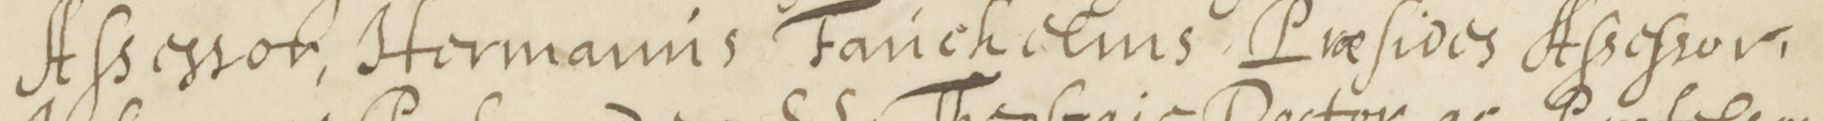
Assesor, Hermanus Fauckelius, Præsides Assessor,
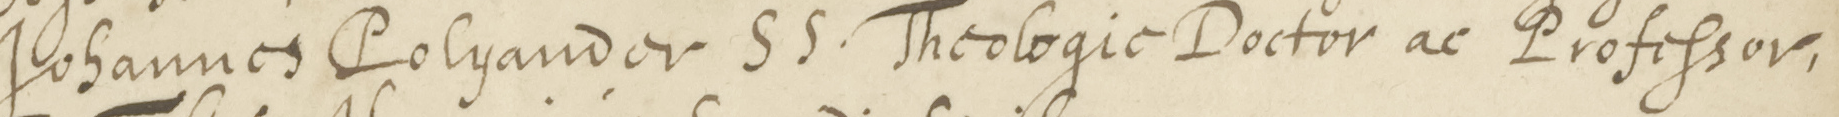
Johannes Polyander S S. Theologie Doctor ac Professor,
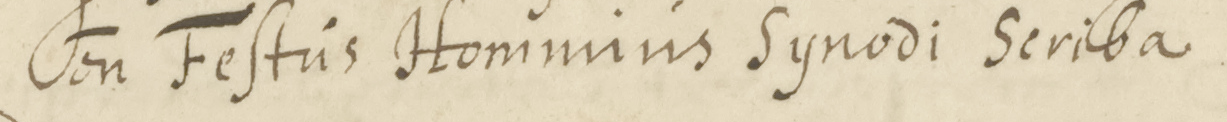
en Festus Hommius Synodi Scriba.
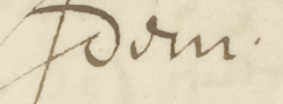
Idem.
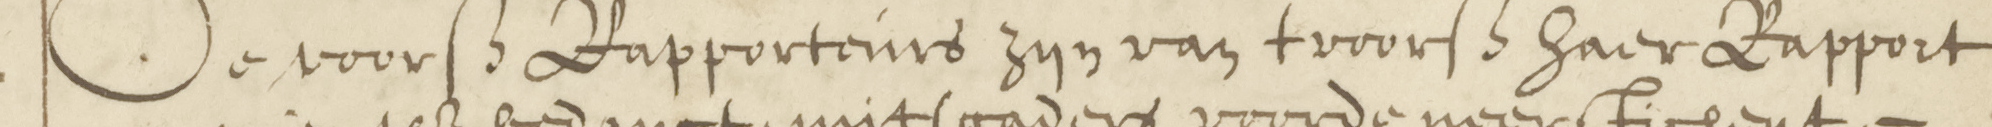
De voors Rapporteurs zyn van tvoors haer Rapport
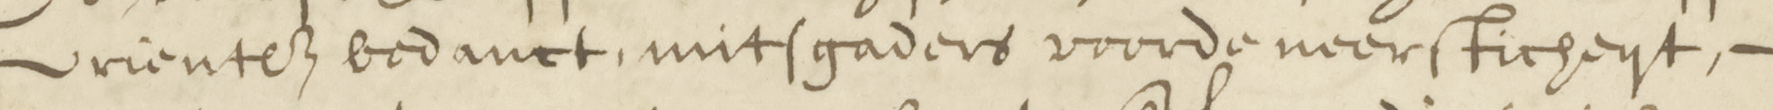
vrientel bedanct, mitsgaders voorde neersticheyt,
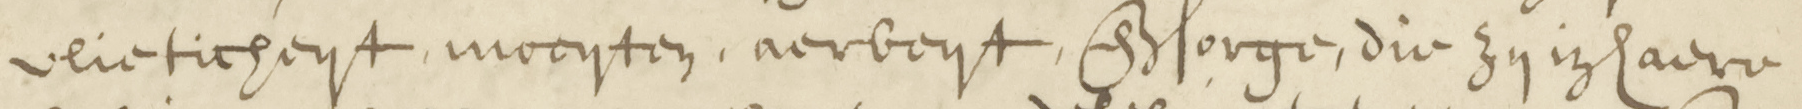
vlieticheyt, moeyten, aerbeyt, & sorge, die zy in haere
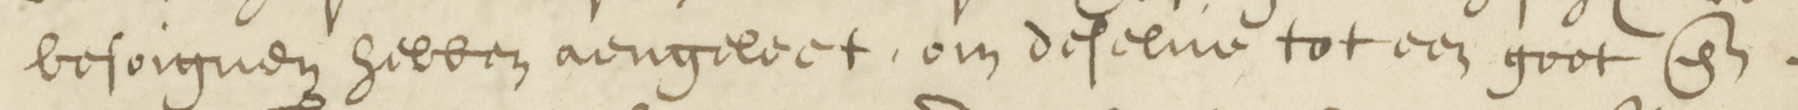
besoignen hebben aengeleet, om deselue tot een goet &
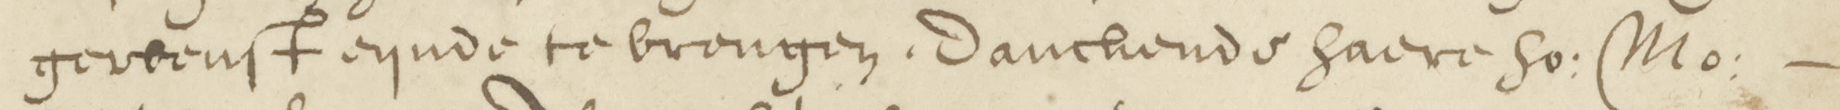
gewenst eynde te brengen, Danckende haere ho:Mo:
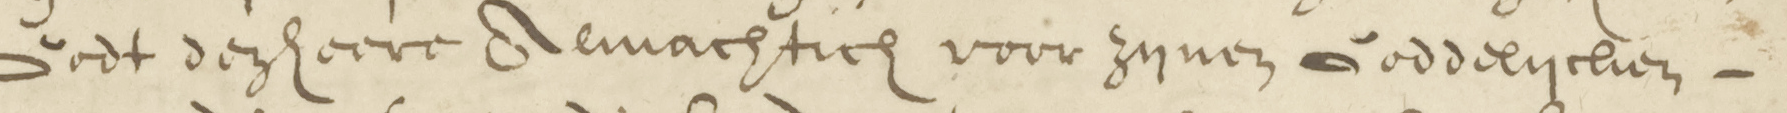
Godt den heere Almachtich voor zynen Goddelycken
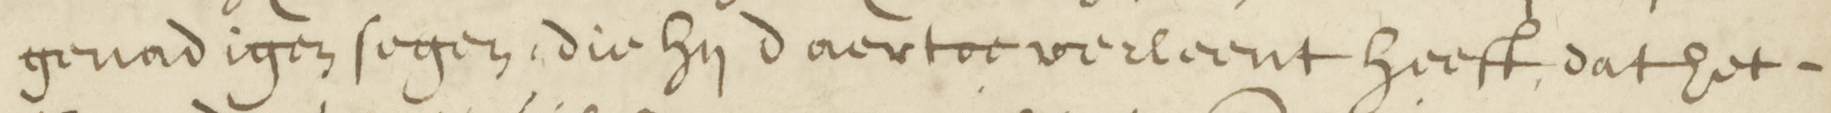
genadigen segen, die hy daertoe verleent heeft dat het
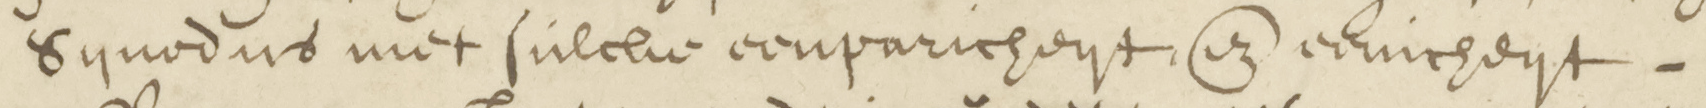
Synodus met sulcke eenparicheyt, en eenicheyt
